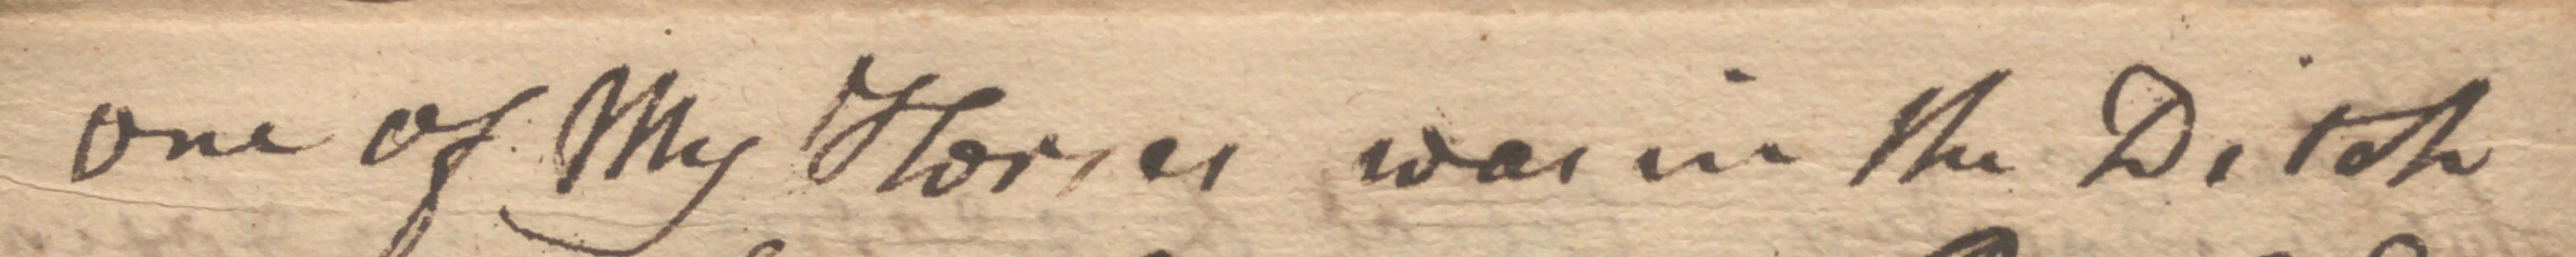one of. My Horses was in the Ditch
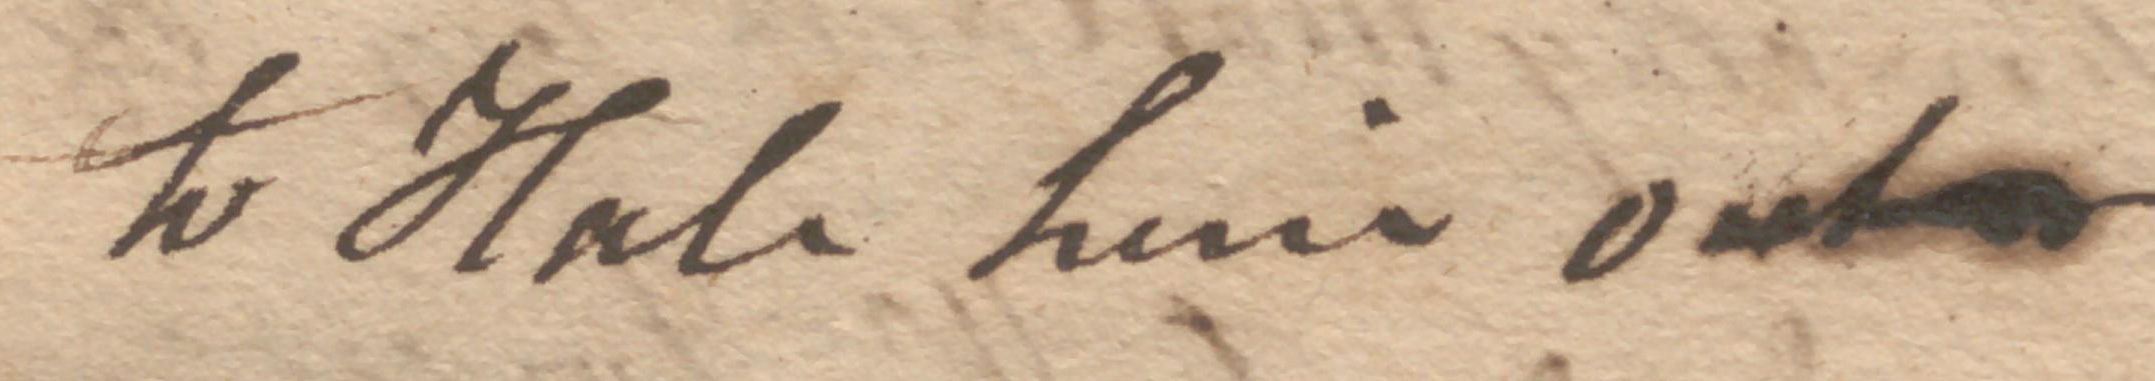to Hale him out
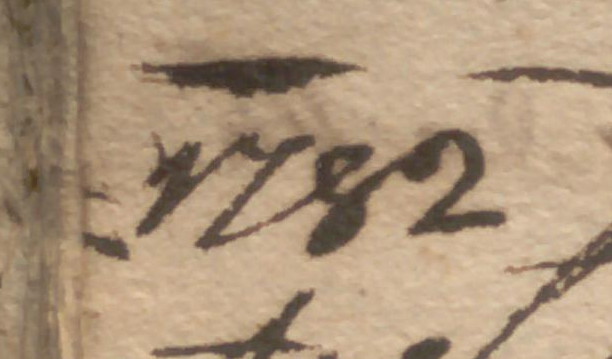1782
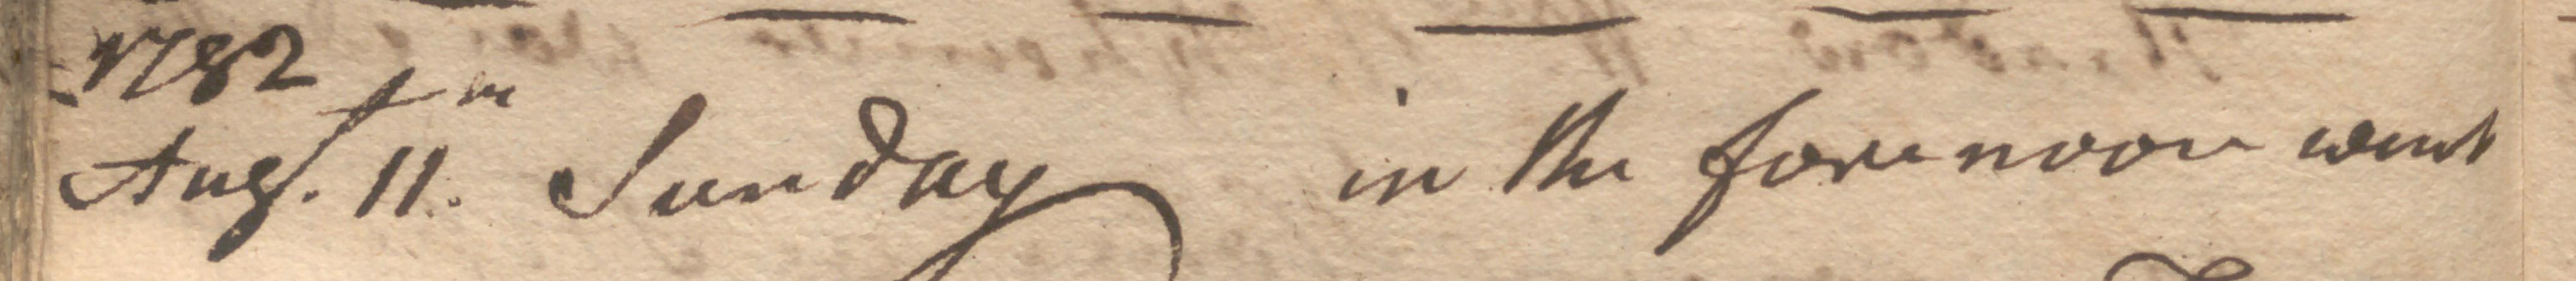Aug^t. 11^h. Sunday in the forenoon went
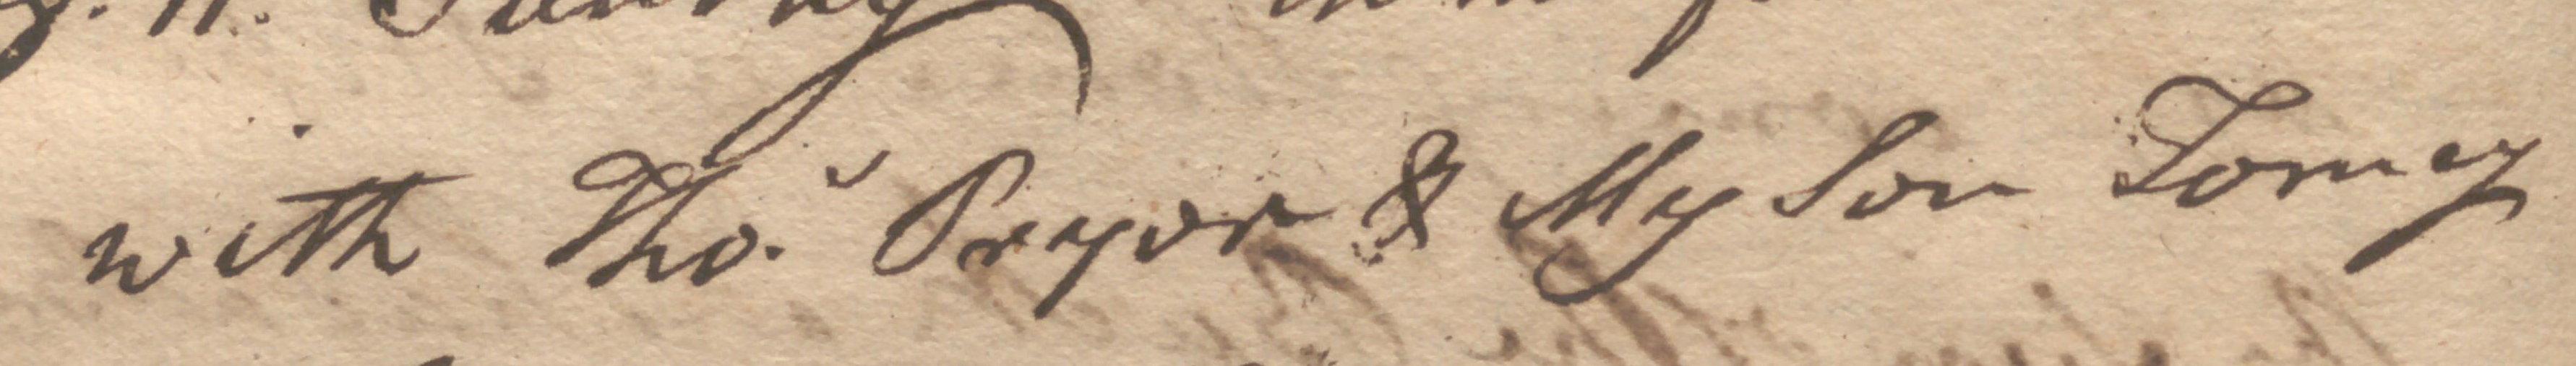with Tho^s. Pryor & My son Tomey
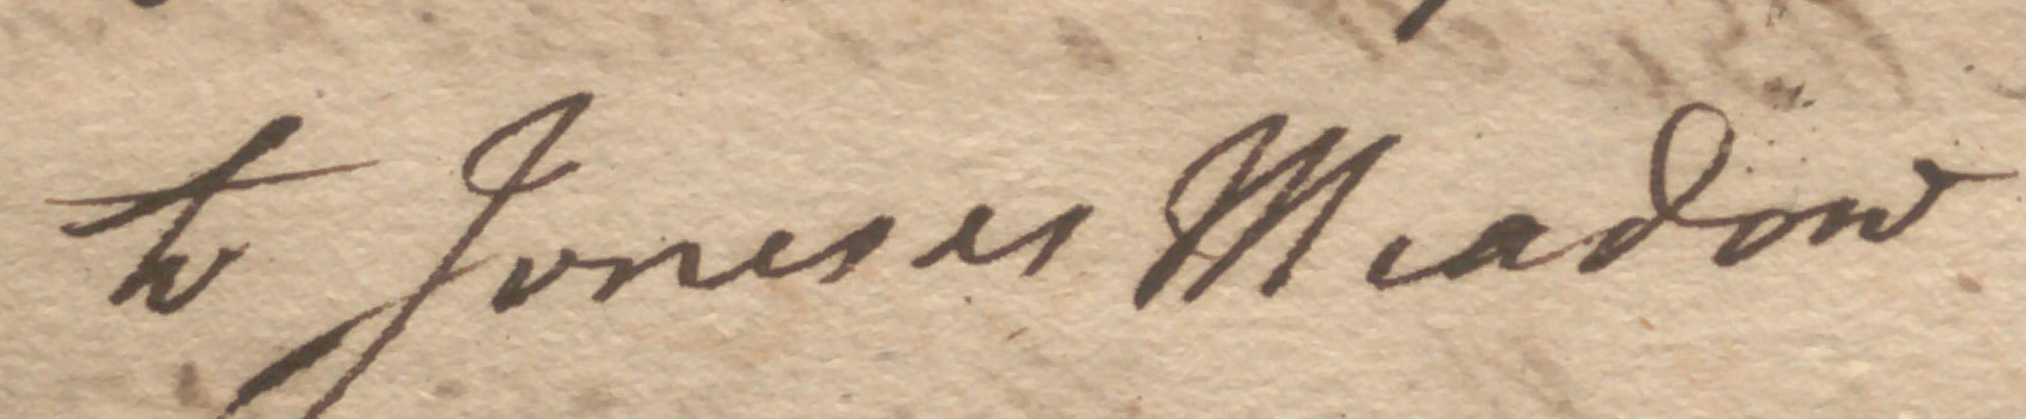to Joneses Meadow
